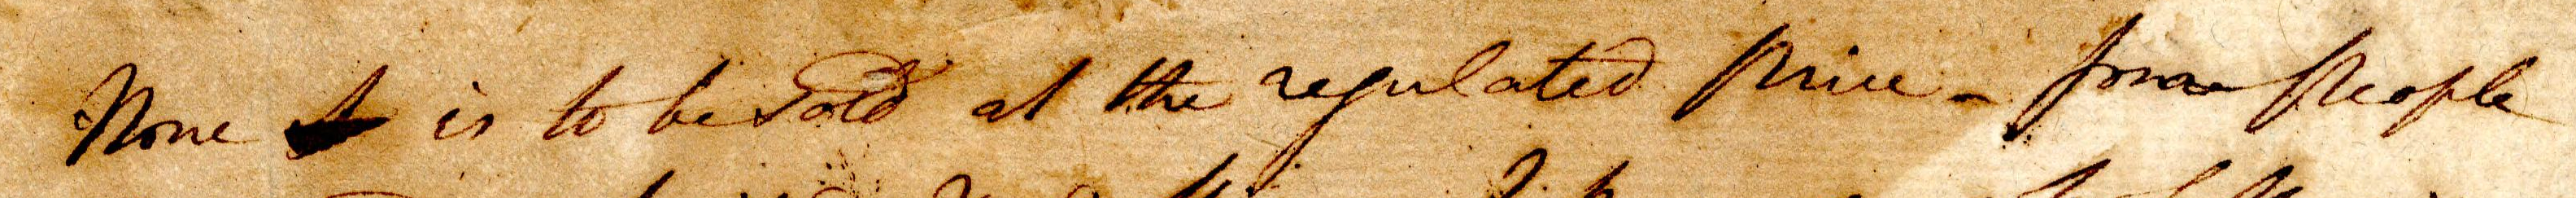None & is to be sold at the regulated price, for a People
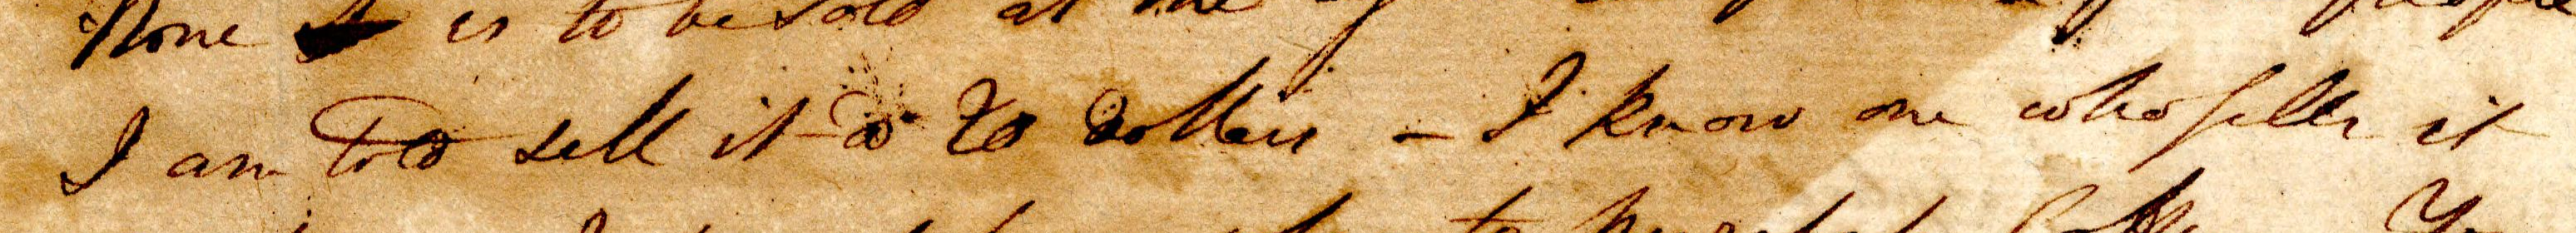I an told sell it per 20 dollars. I know one who sells it
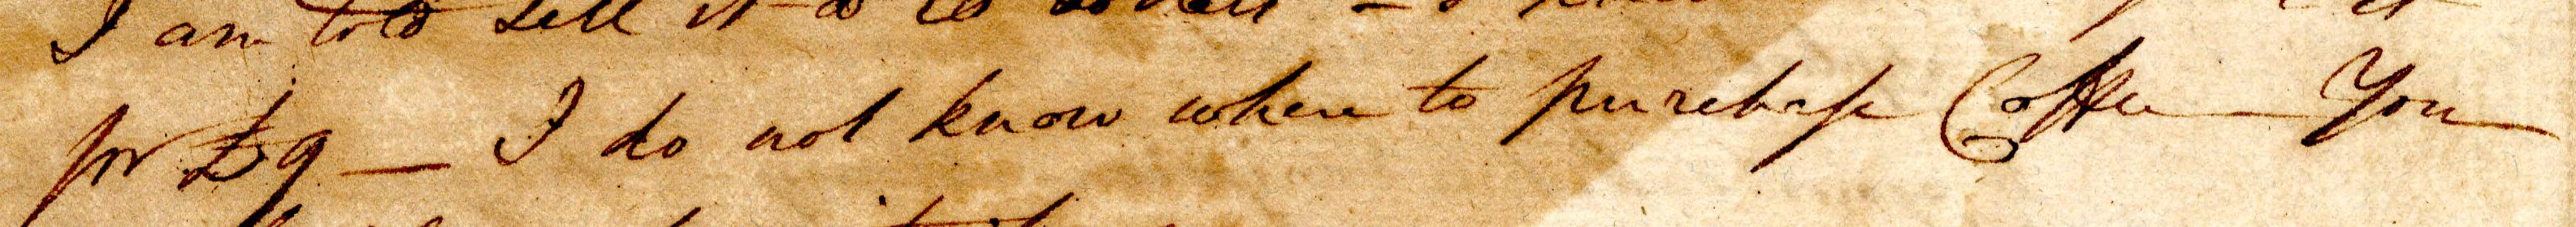for £9. I do not know where to purchase Coffee. You
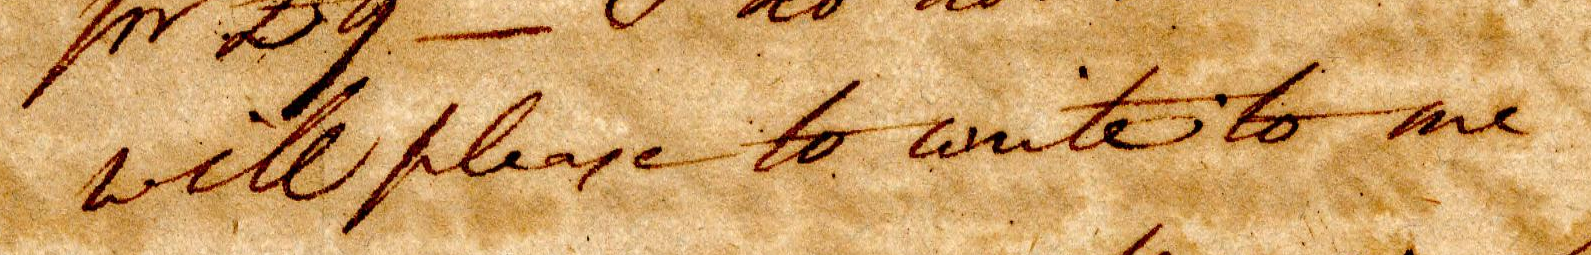will please to write to me.
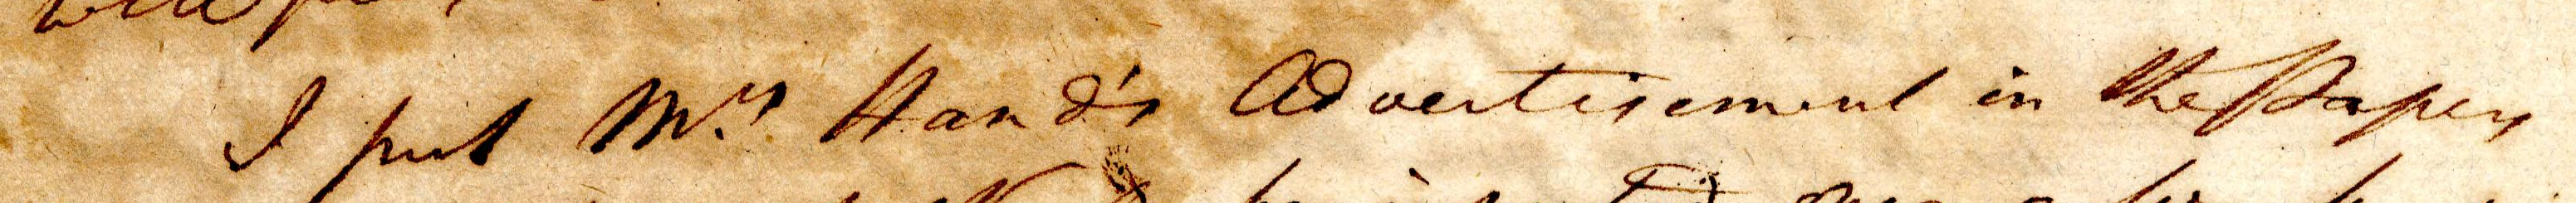I put M^r. Hand's Advertisement in the Papers
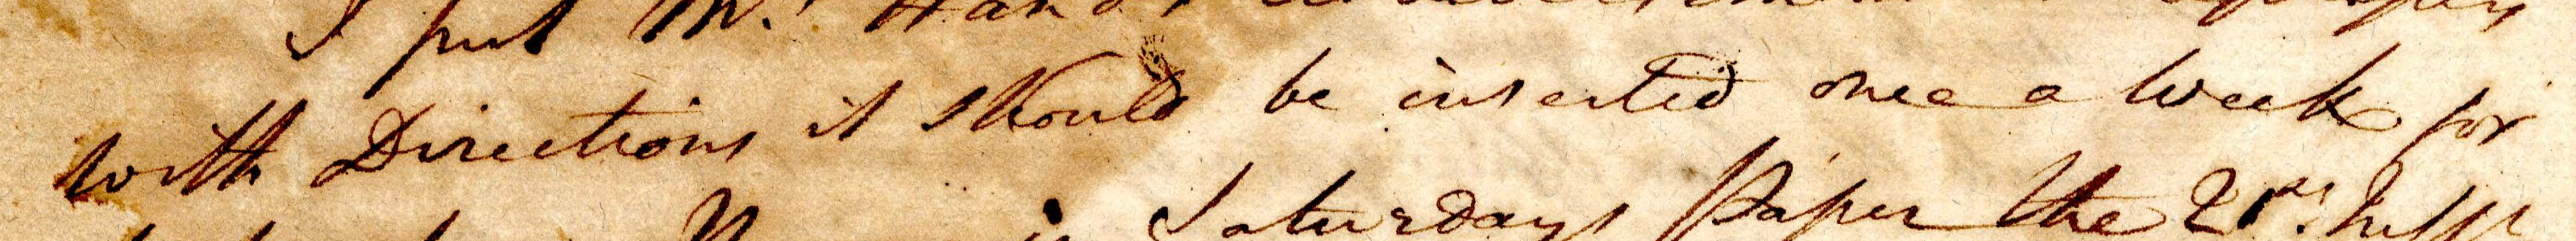with Directions it should be inserted once a week for
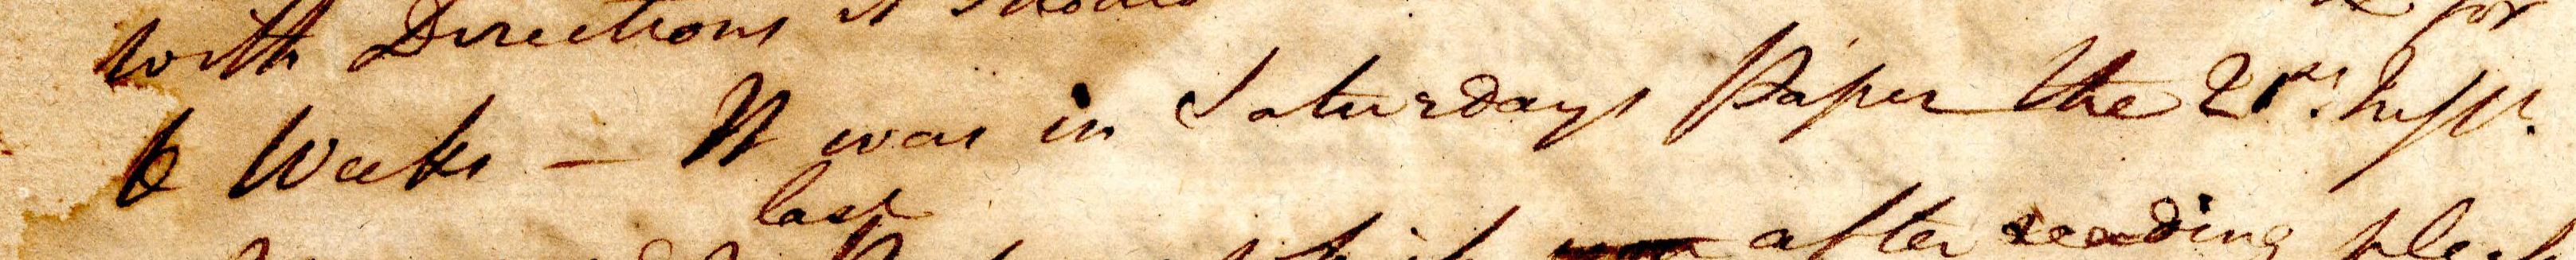6 Weeks. I was in Saturdays paper the 21^st. Inst^t.
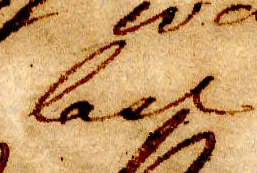last
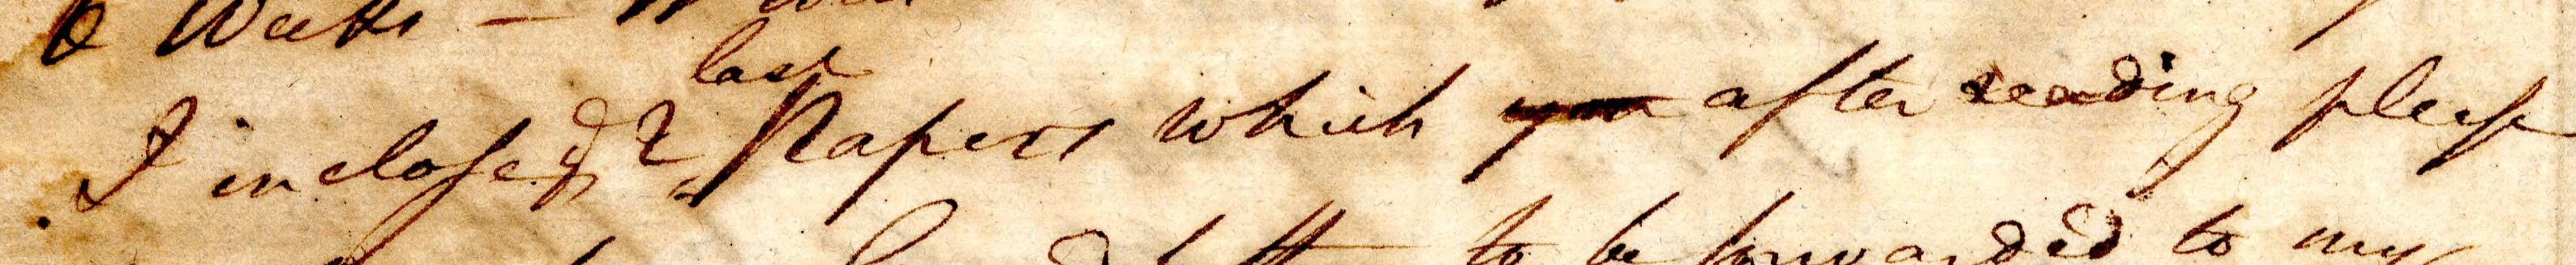I inclosey y^e 2 ^ Papers which you after reading please
